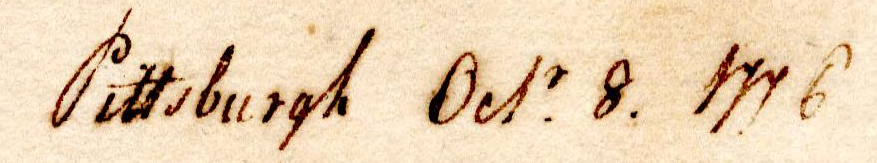Pittsburgh Oct^r. 8. 1776
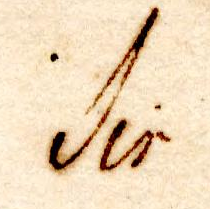Sir
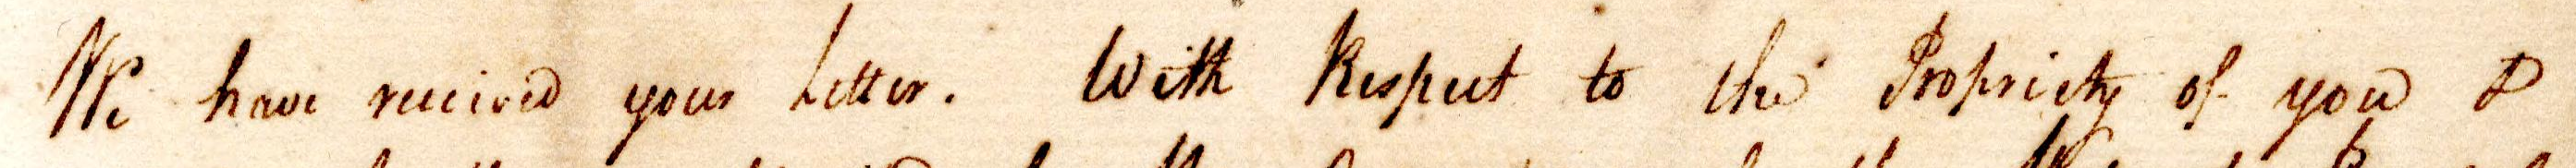We have received your Letter. With Respect to the Propriety of you &
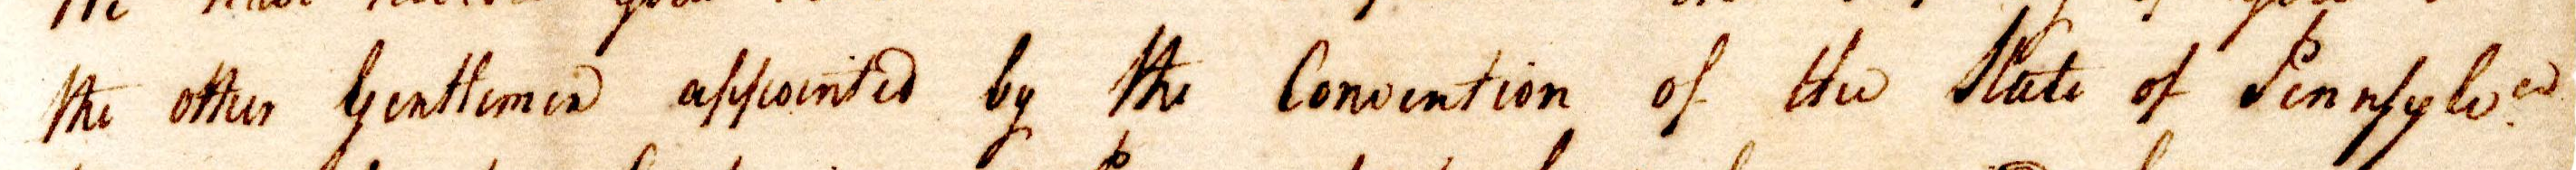the other Gentlemen appointed by the Convention of the State of Pennsylv^a.
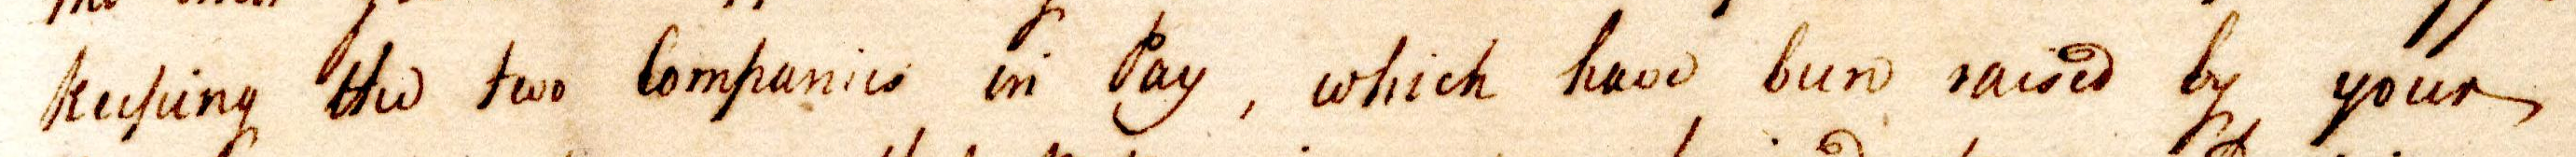keeping the two Companies in Pay, which have been raised by your
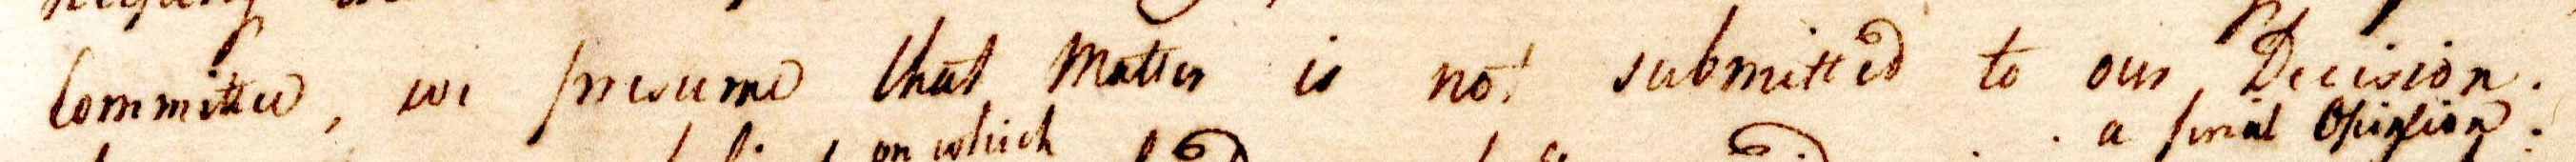Committee, we presume that Matter is not submitted to our Decision.
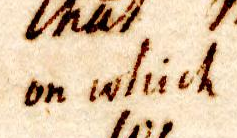on which
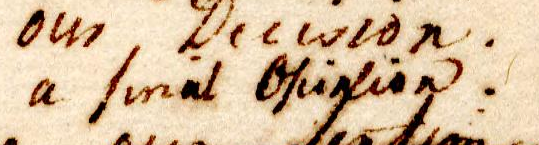a final Opinion.
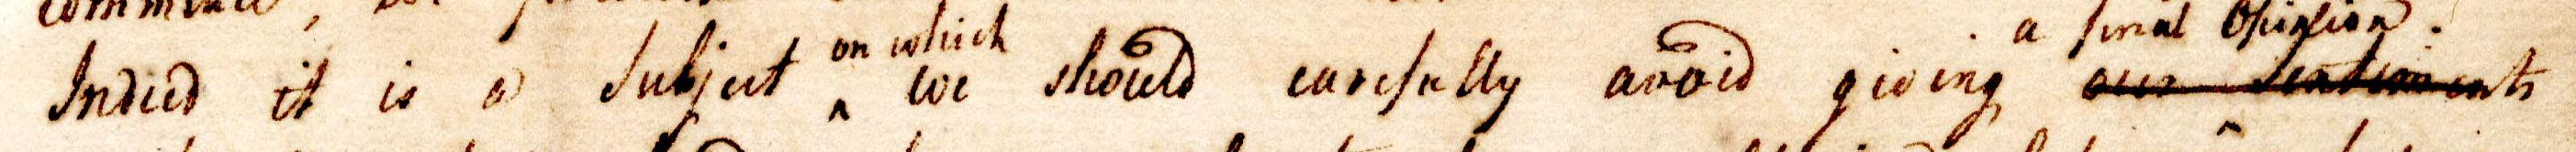Indeed it is a subject ^ we should carefully avoid giving ^ our Sentiments
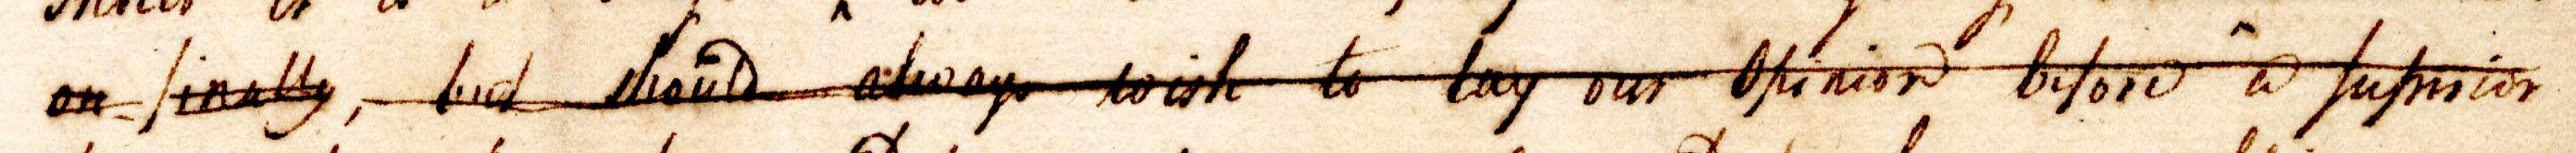on finally, but should always wish to lay our Opinion before a superior
